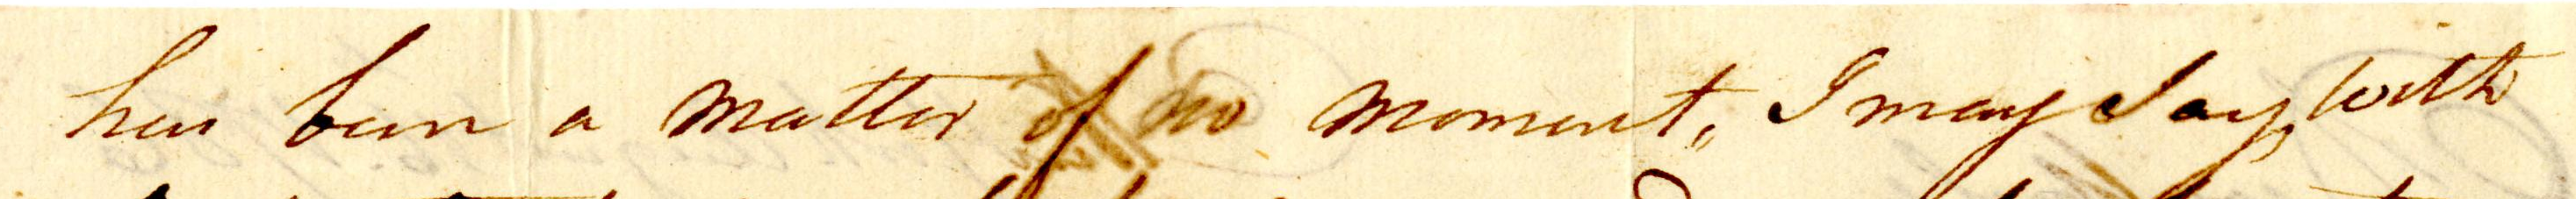has been a matter of no moment, I may say, with
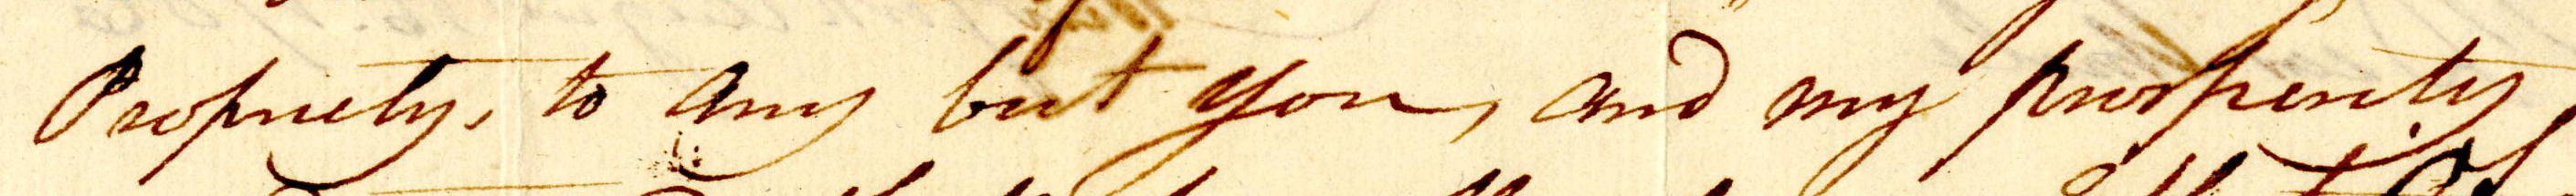Propriety, to any but you, and my property
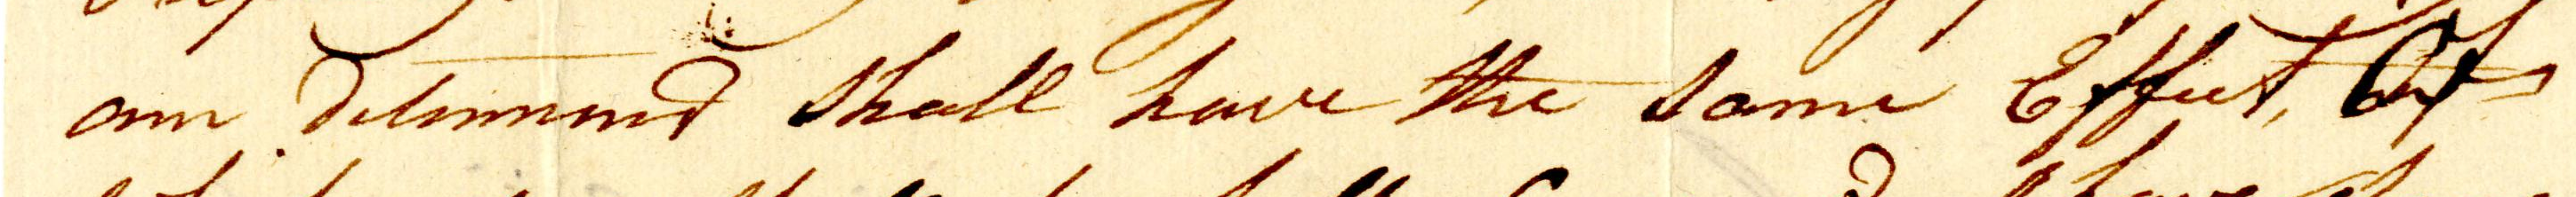am determined shall have the same Effect, Of
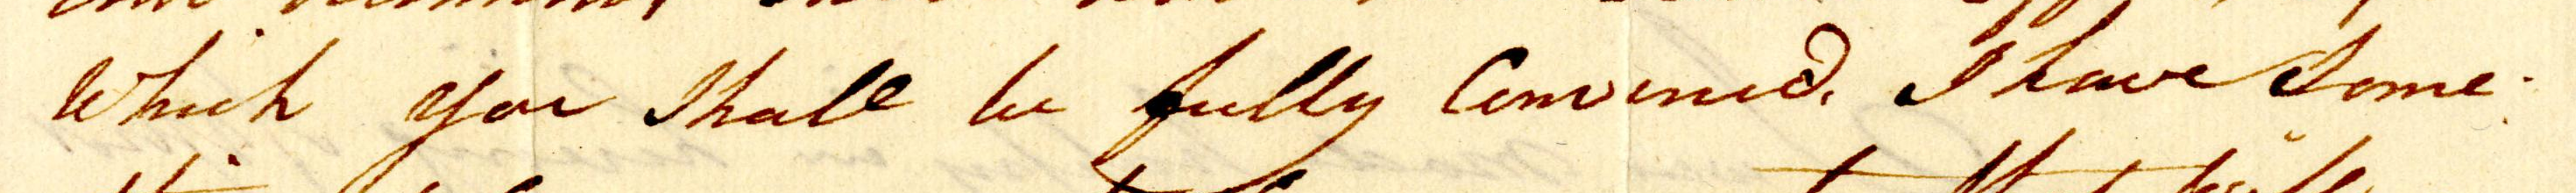which you shall be fully Convinced. I have some-
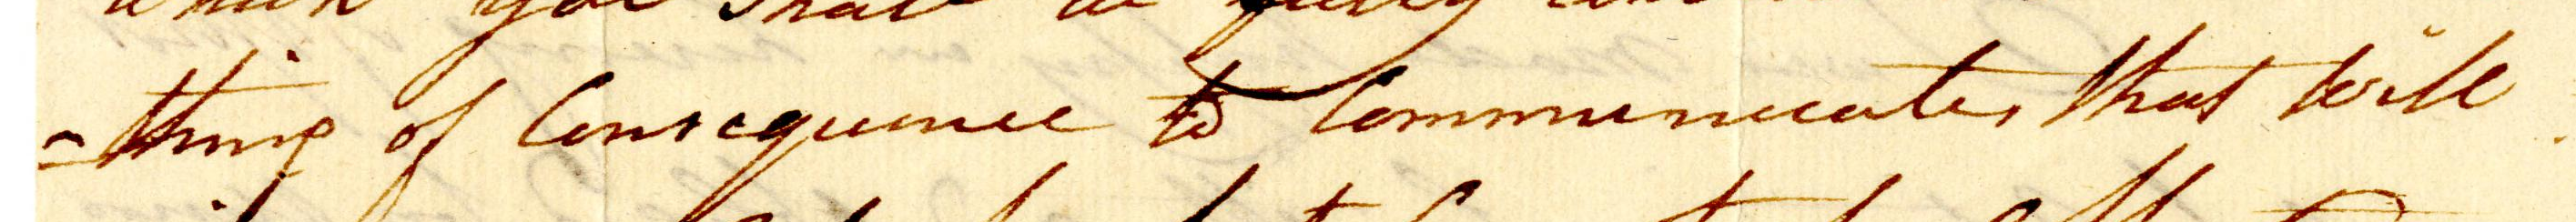-thing of consequence to communicate that wile
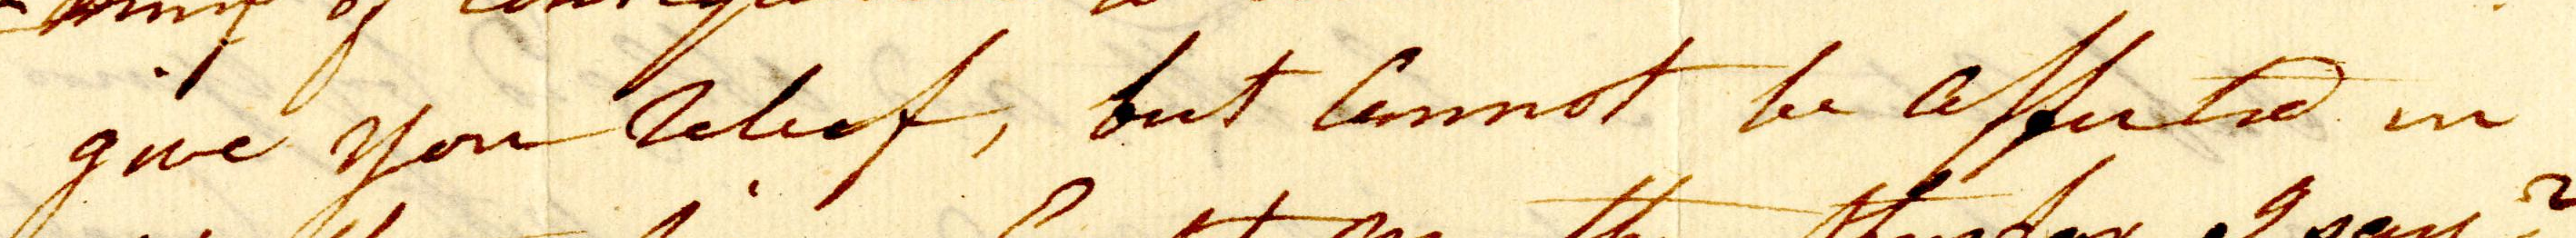give you relief, but Cannot be affected in
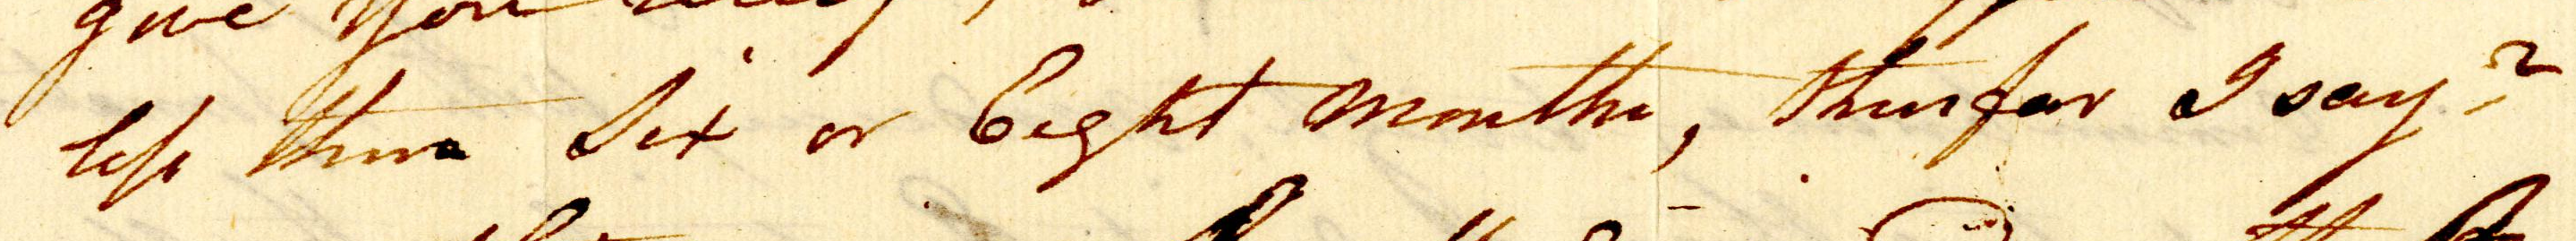less there six or eight months, therfor I say ^2
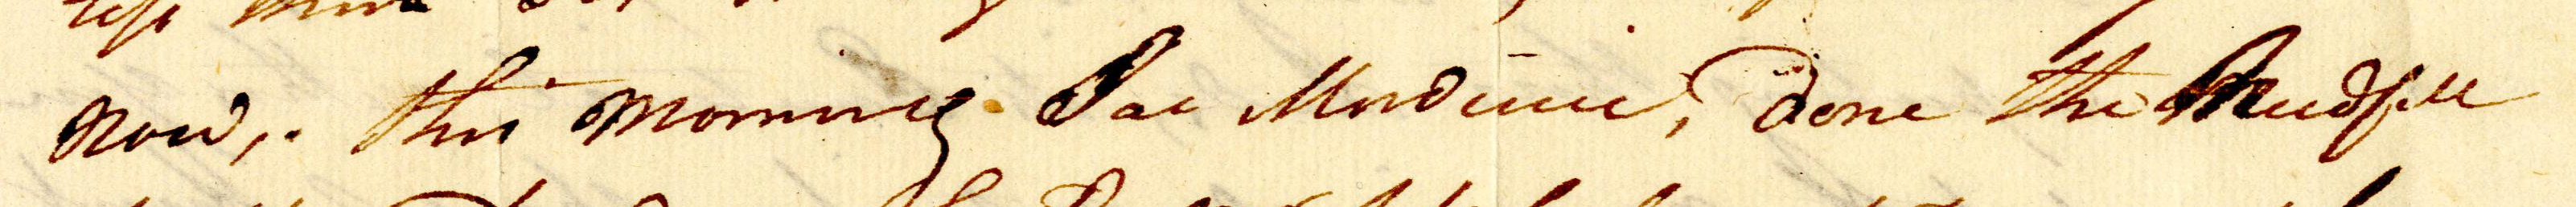now; this morning Jac Mordecai, done the needfell
